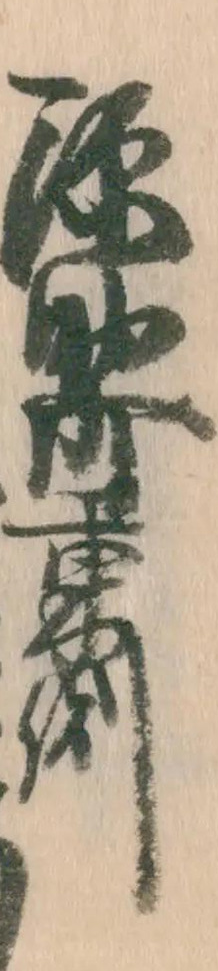同源助町東側
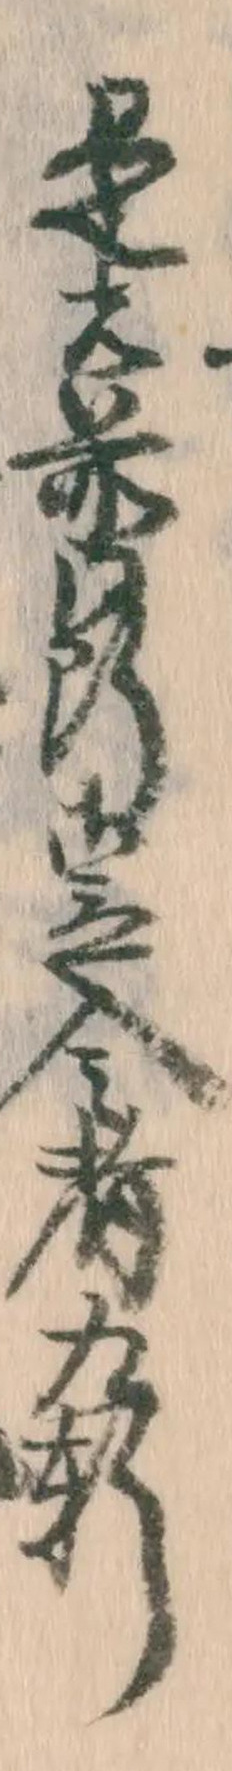是は前同断御立入之者九軒
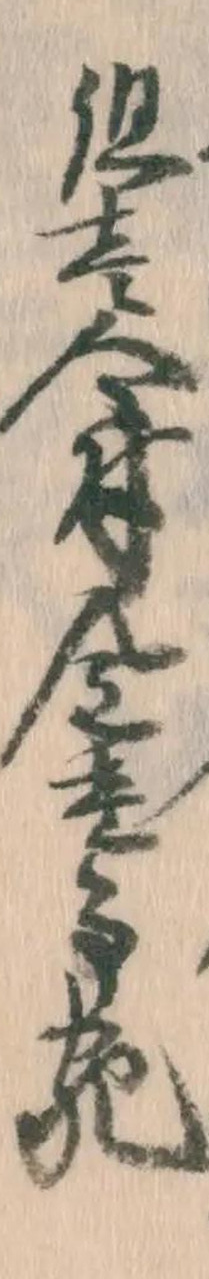但壱人ニ付金壱分宛
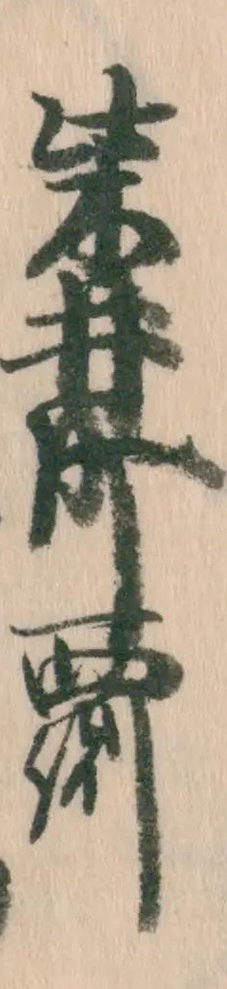同柴井町西側
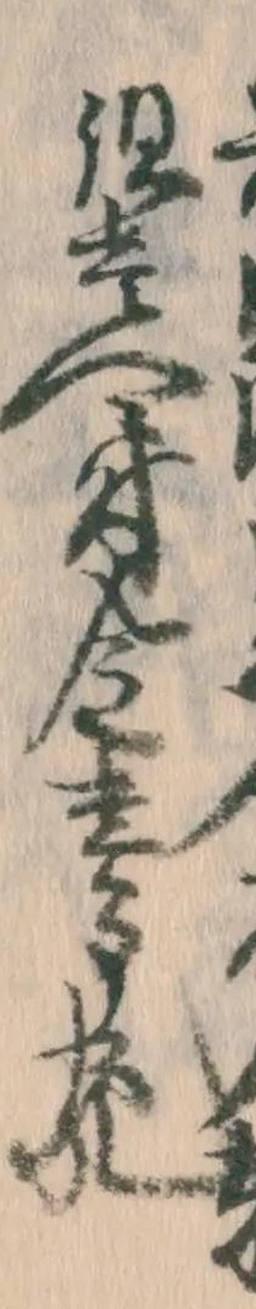但壱人ニ付金壱分宛
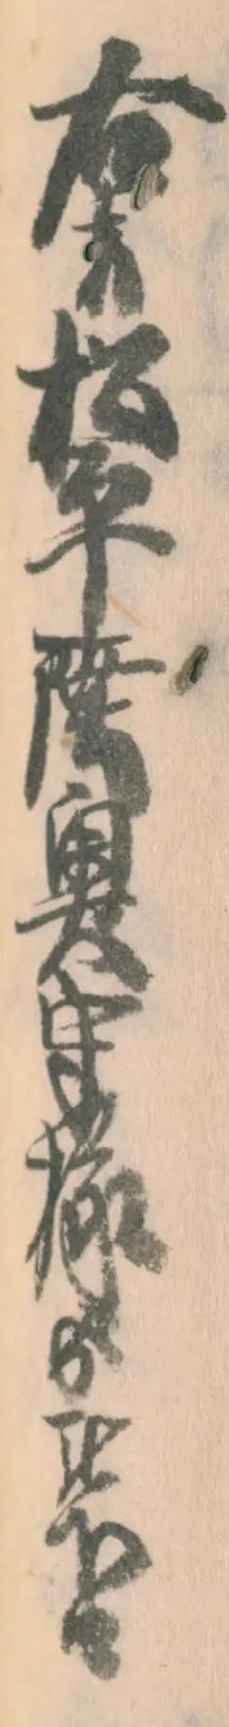右は松平陸奥守様ゟ被下候
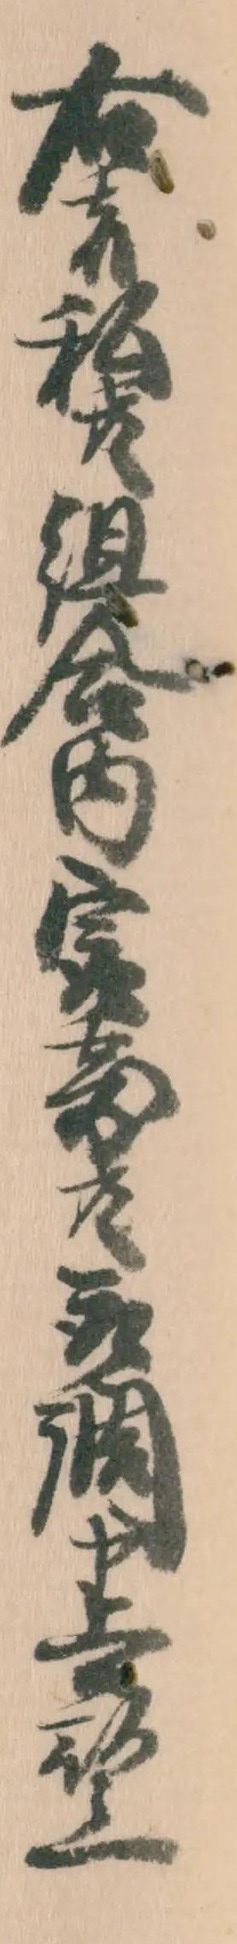右は私共組合内最寄共取調申上候以上
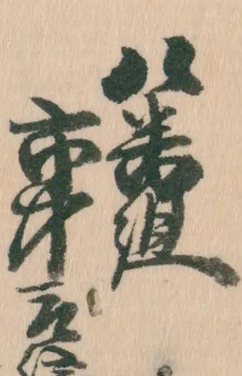八番組
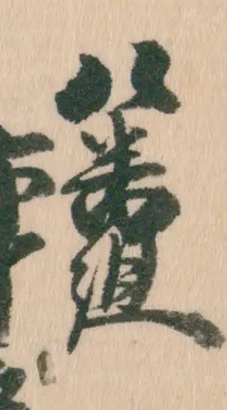八番組
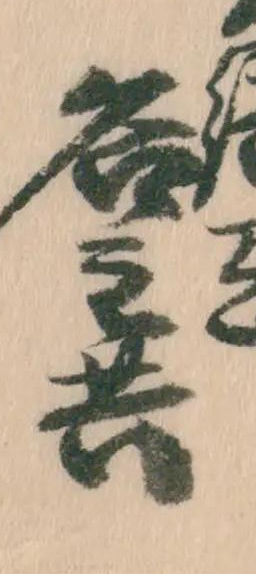名主共

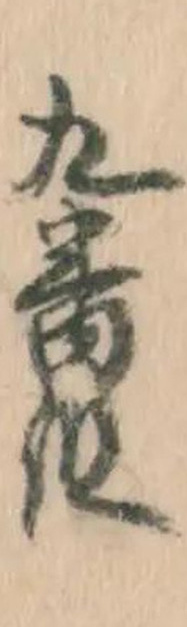九番組

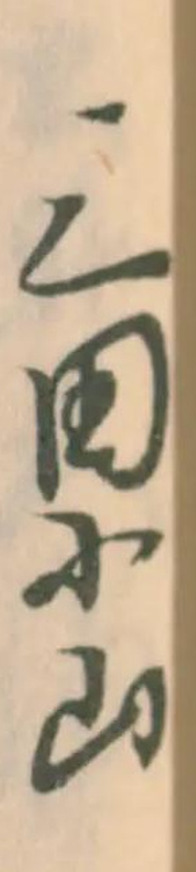三田小山
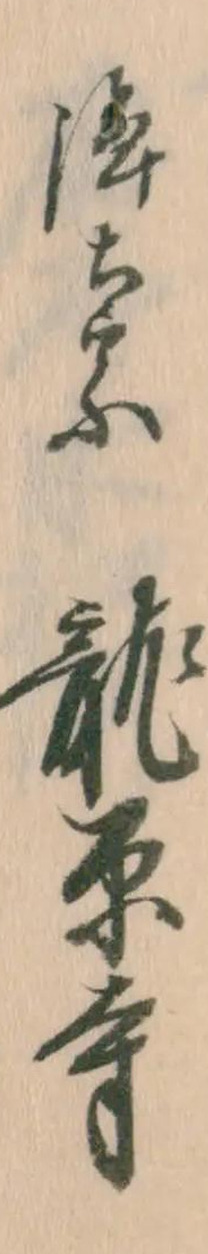浄土宗龍原寺
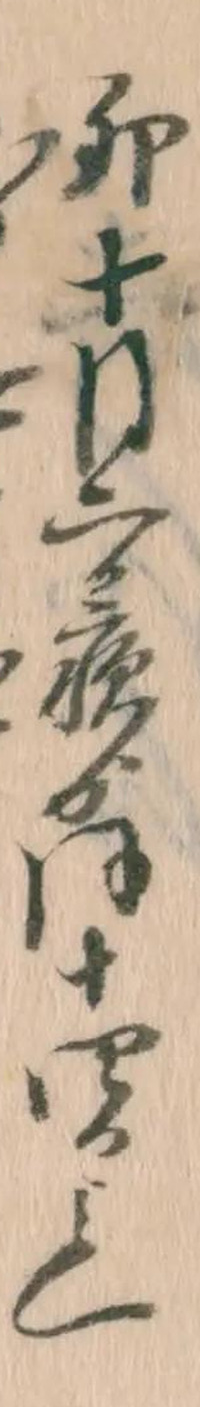卯十月二日夜ゟ同十四日迄
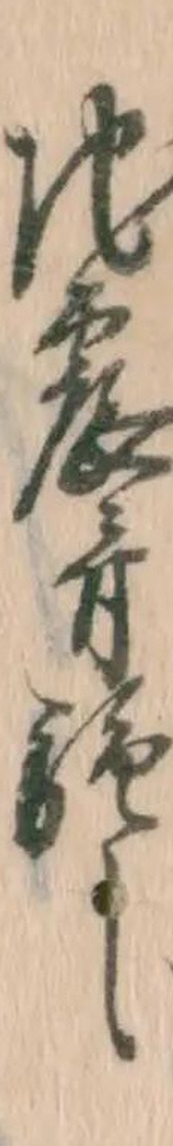地震ニ付施し
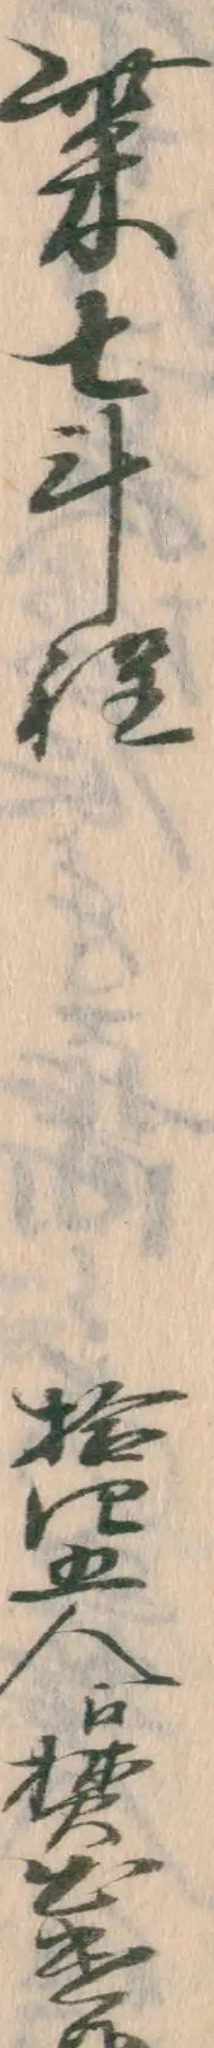此米七斗程拾四五人え焚出遣候
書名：武家方并寺院等ニテ施差出候一件
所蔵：国立国会図書館 National Diet Library, JAPAN
